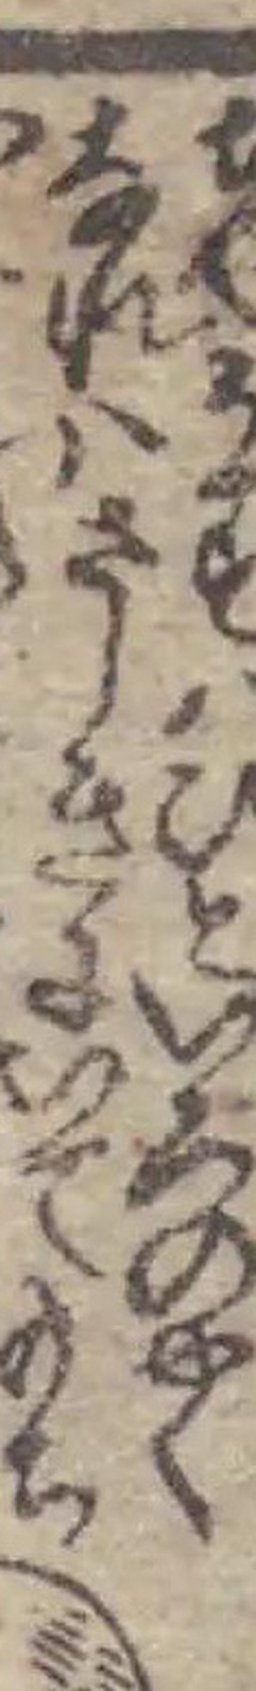なれはさしきにいてもち
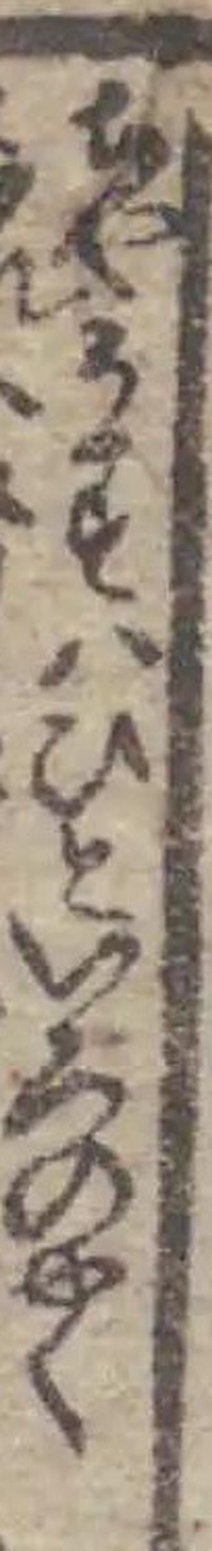ちやうすはひといろのやく
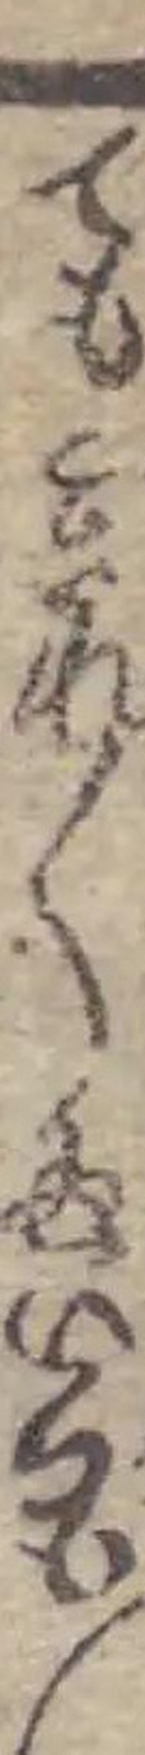てもこされ〳〵たいつも
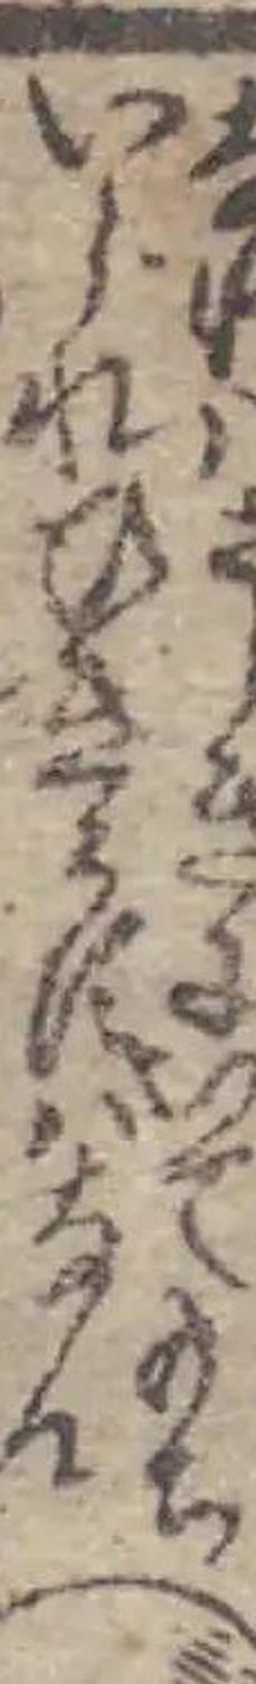いられひきうすはなん
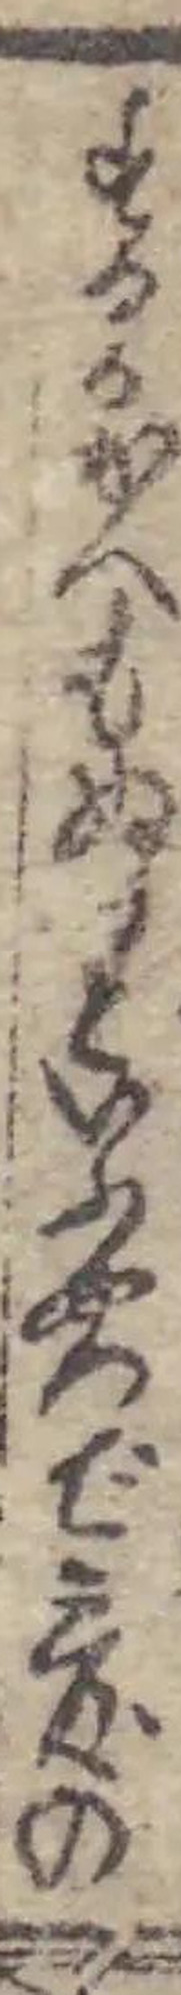するかかへもぬといふやつで三度の
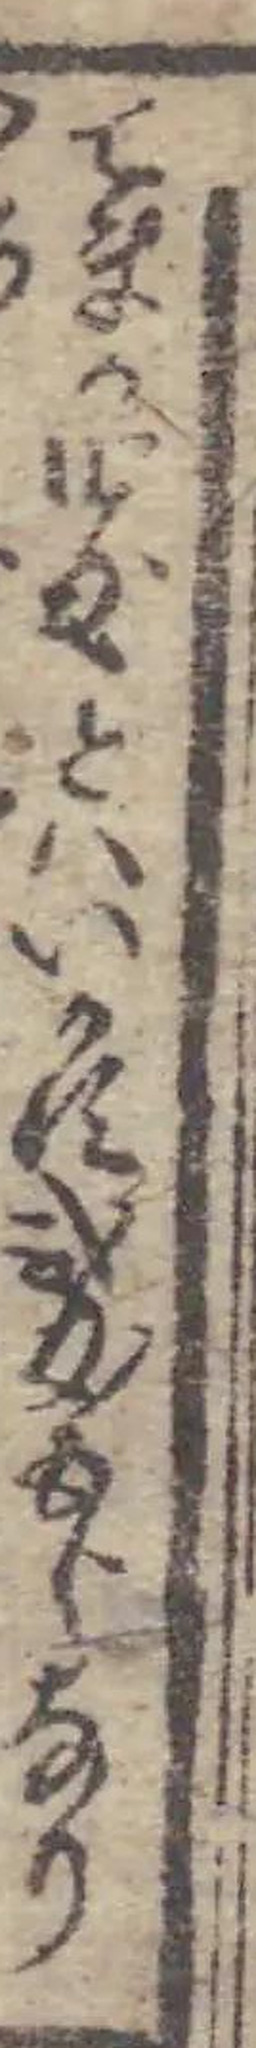てまか四度とはいかす弐度もじなり
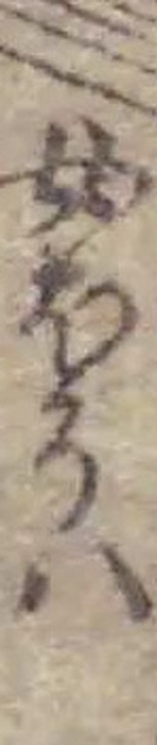女ほうは
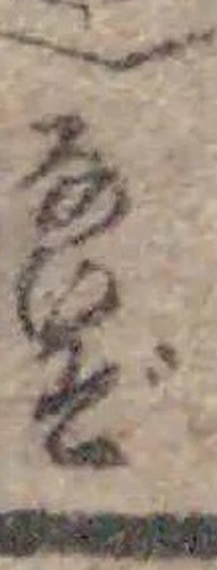ないぞ
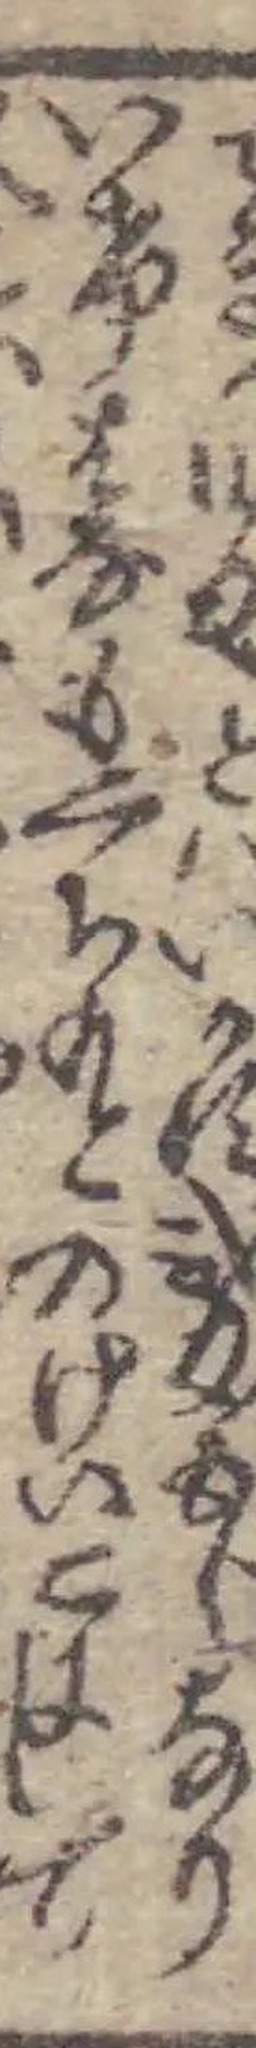いけはなもくちもとのけいこにして
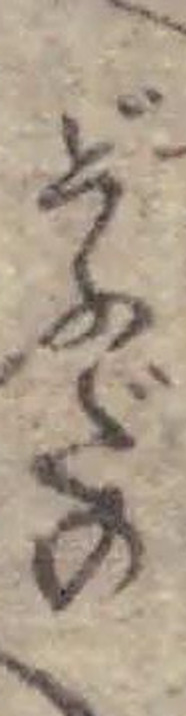どうだの
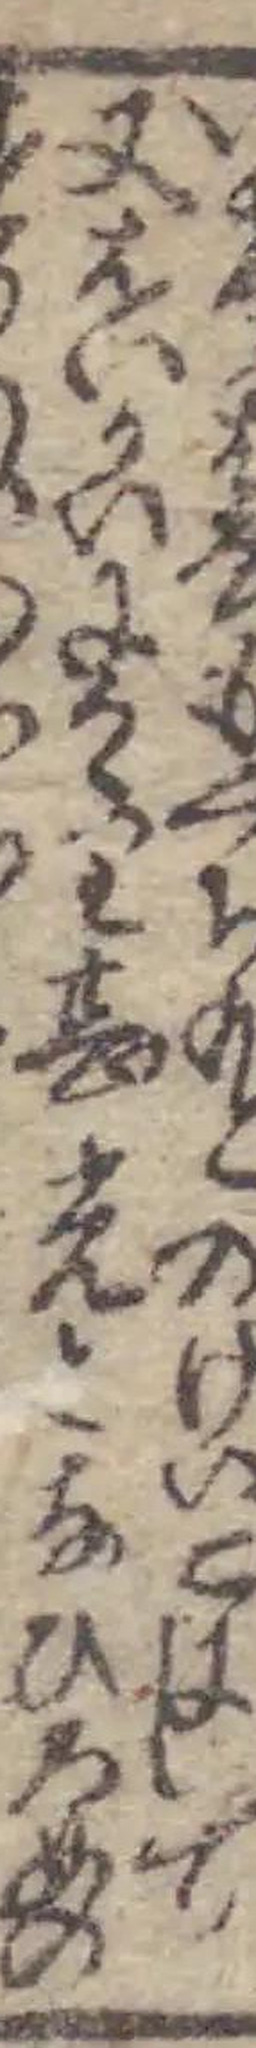又はいかいにかゝり甚光となひろめの
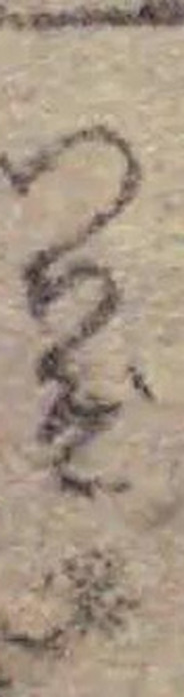ないぞ
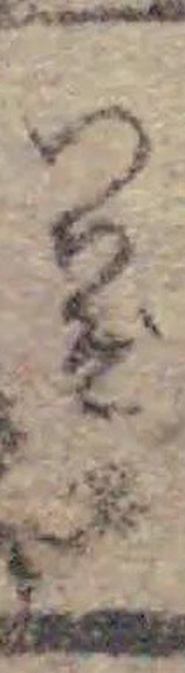ないぞ
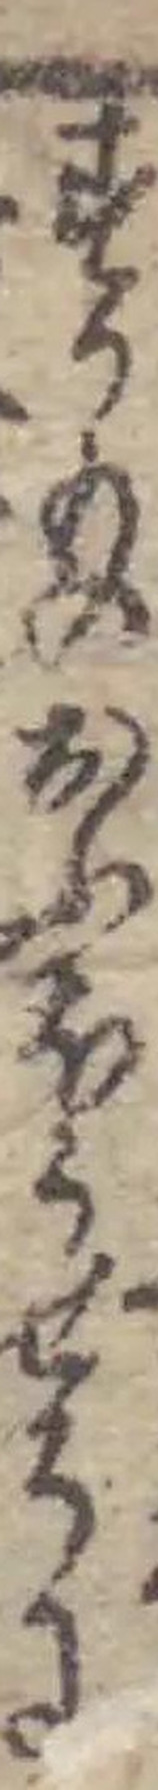すりものおふほうせうに
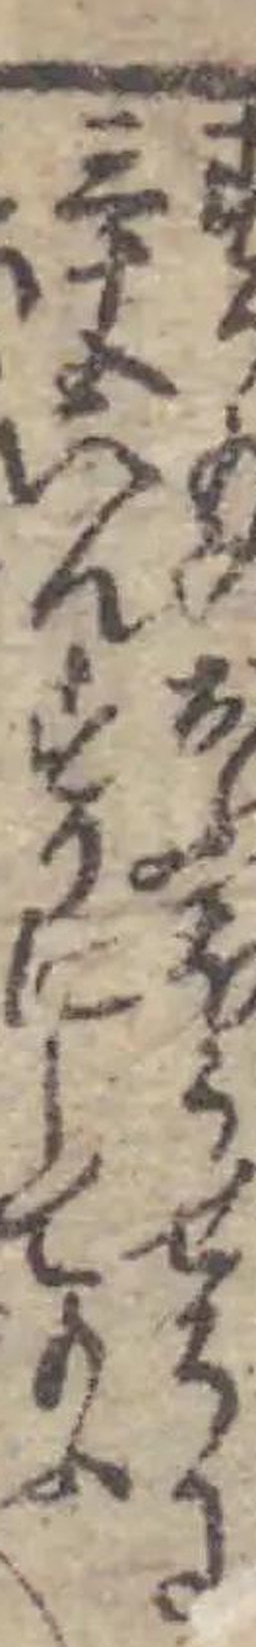三十五へんすりにしてもふ
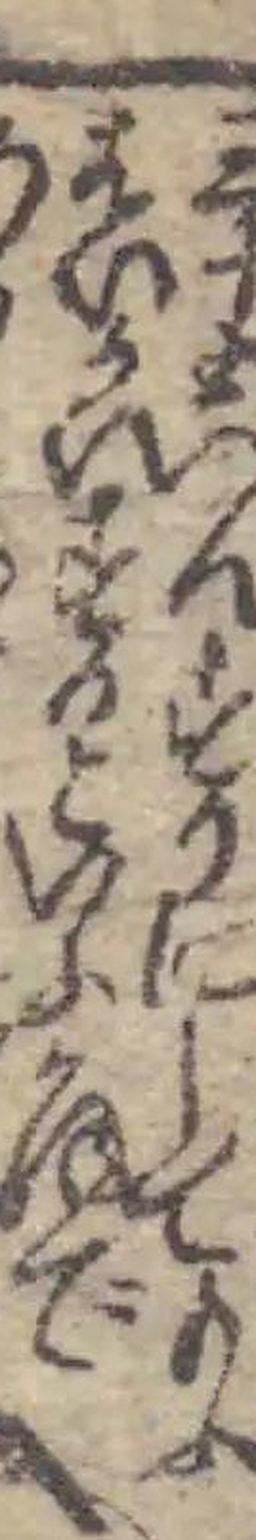はいかいするといふかほで
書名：津以曽無弟の甚六 3巻
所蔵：国立国会図書館 National Diet Library, JAPAN
